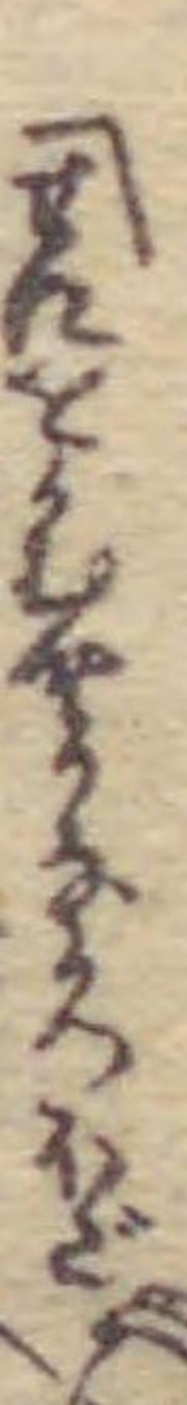〽せけをかむやうなかつほだ
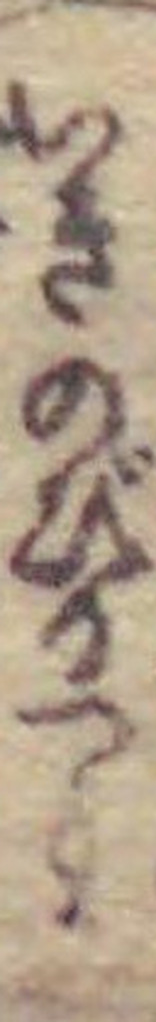いきのびるつもり
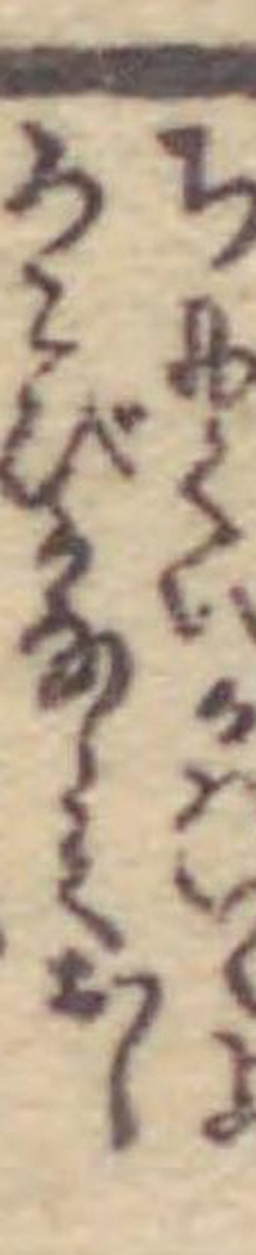ろこびかなしみおし
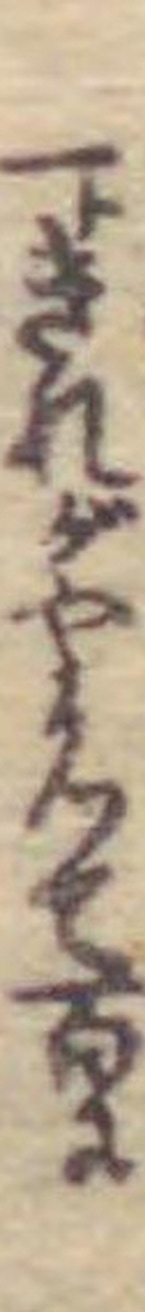一百に
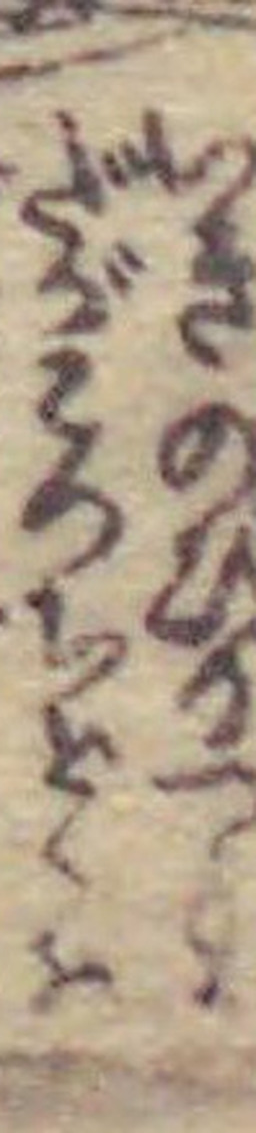だがこつちどらは
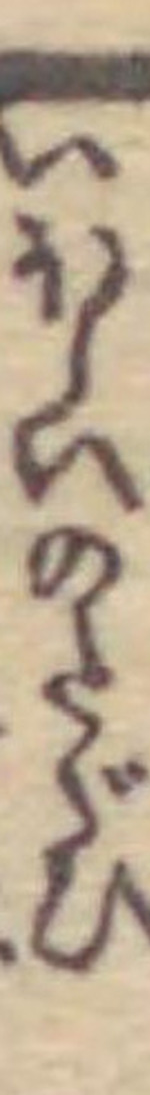いほしいのたぐひ
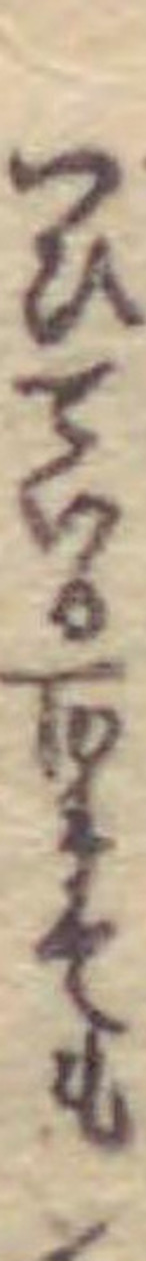つひている百まても
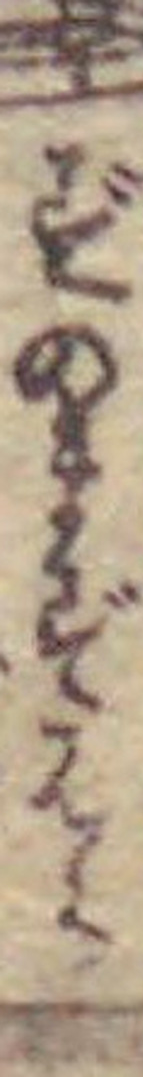ずのまずはら
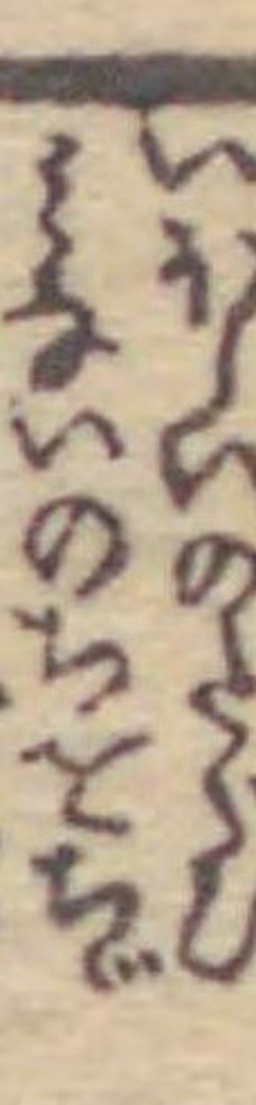みないのちをちゞ
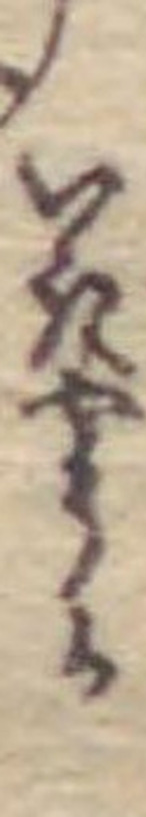いきやうか
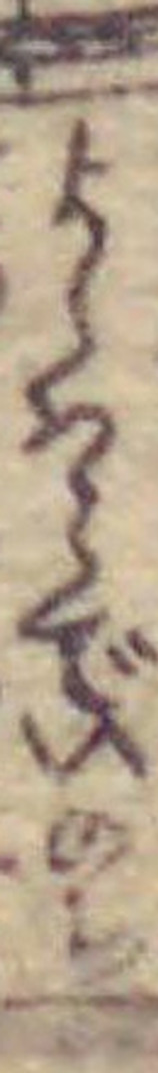よしはらでいのち
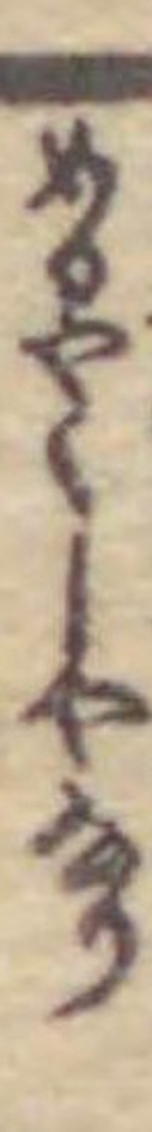めるやくしやなり
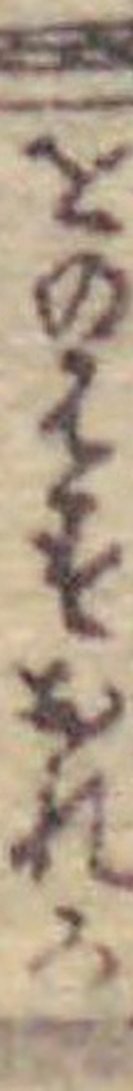をのはすおれか
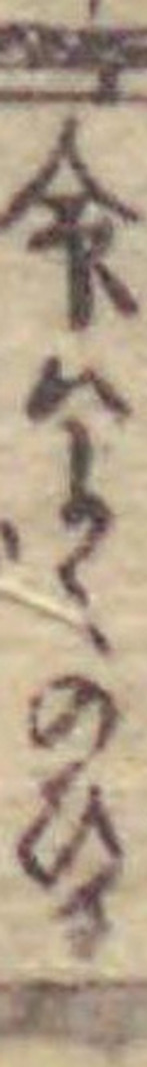命はよくのひる
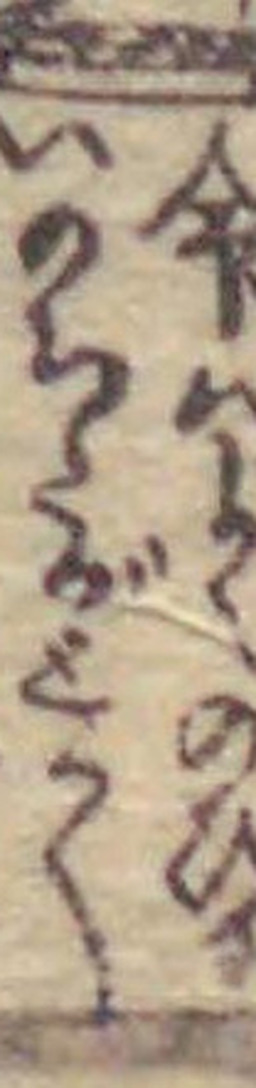いのちたがとかく
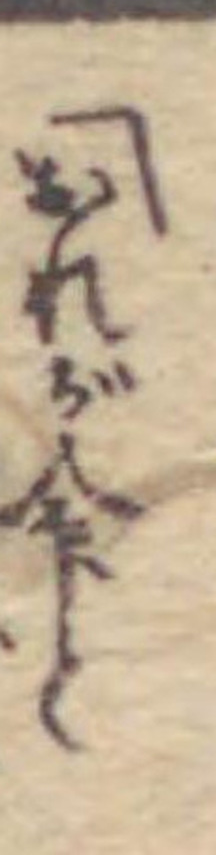〽おれが命と
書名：御誂染長寿小紋 : 3巻
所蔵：国立国会図書館 National Diet Library, JAPAN
